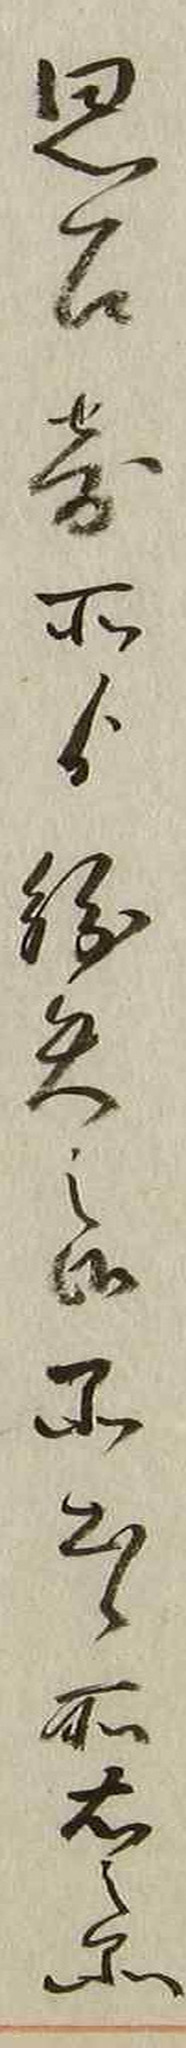思召寄所ゟ紛矢之御品出候所右之品
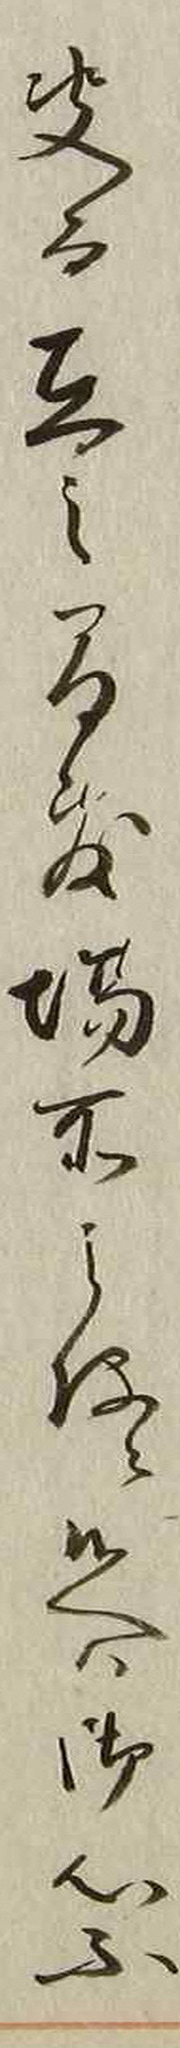決而在之間敷場所之儀に候へは御心不
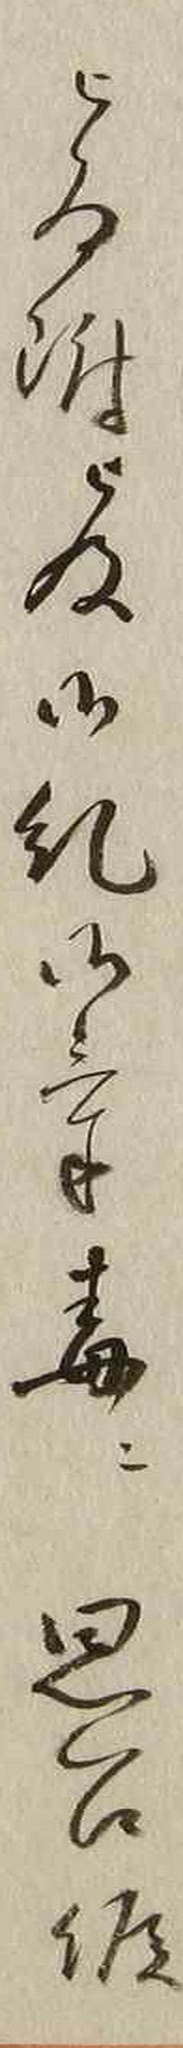被行附被為御糺御気毒に思召候
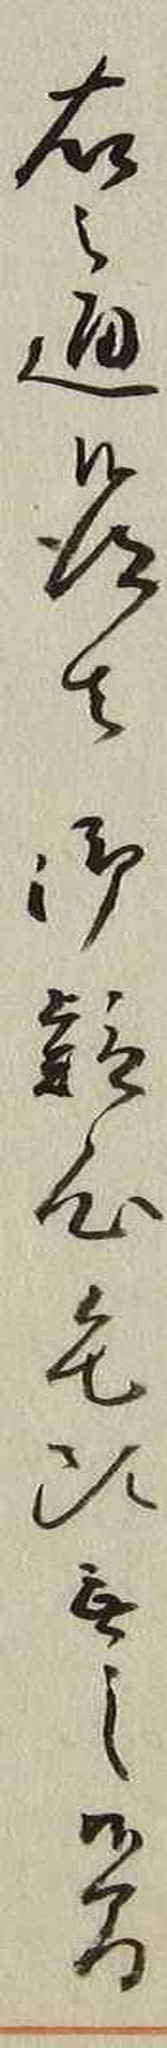右之通候得は御疑心毛頭無之候間
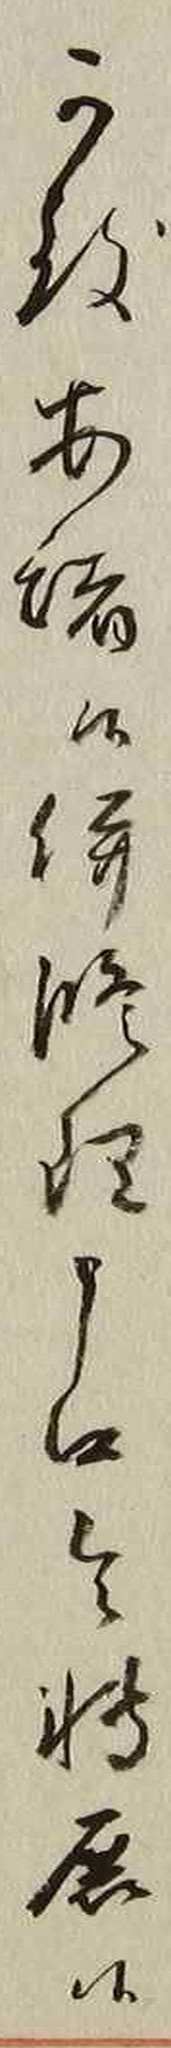可致安堵候併修理申候今転広候
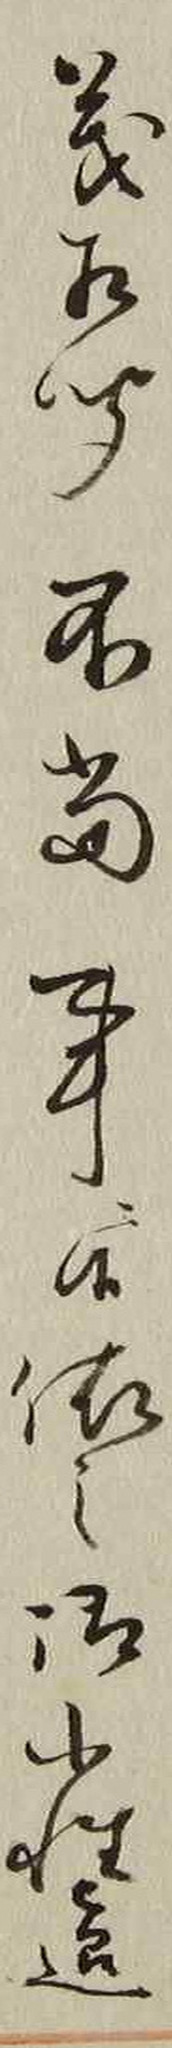義相聞不当事に候依之御小性被退
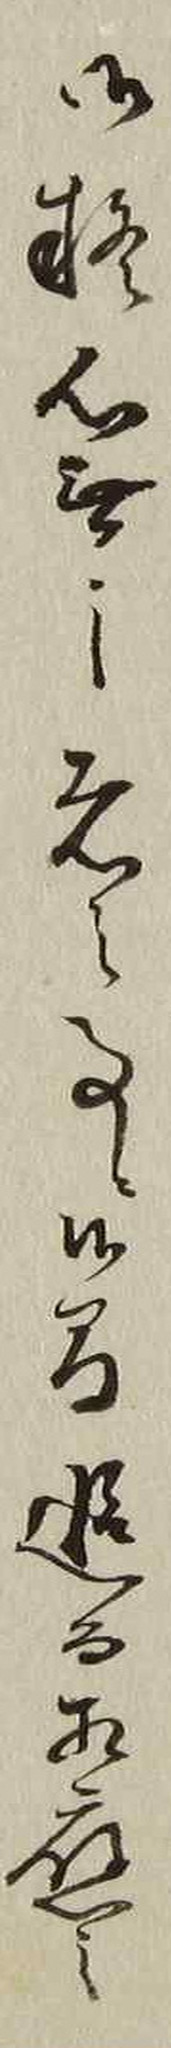御格心無之者之事に候間追而相応之
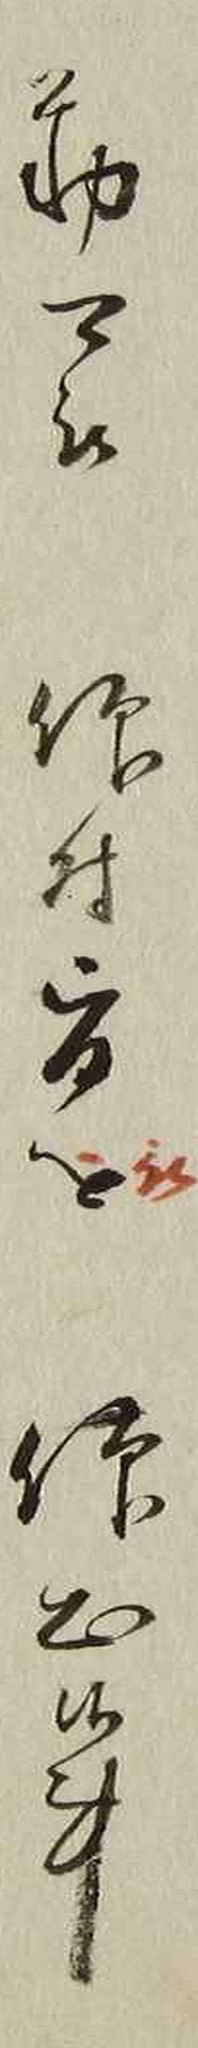勤可被仰付旨被仰出候事
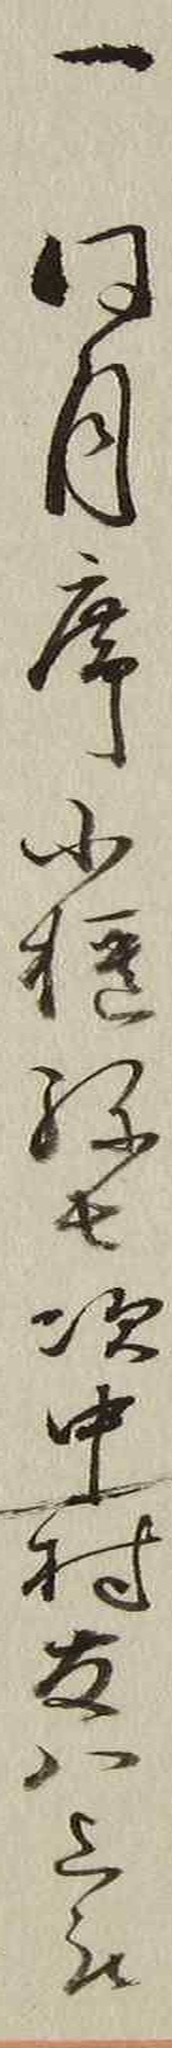一同月席小槇源七次中村友八上被
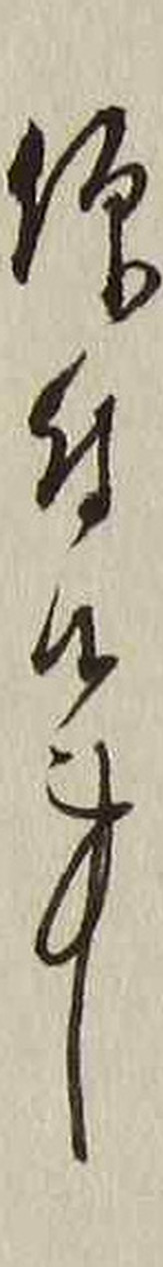仰付候事
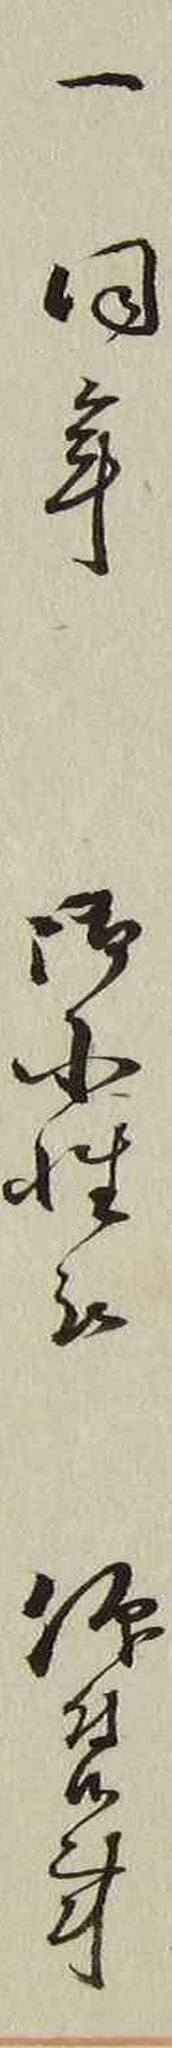一同年御小姓被仰付候事
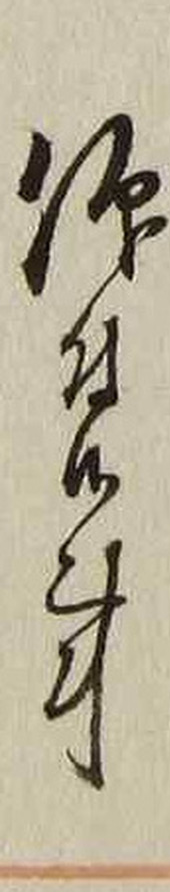仰付候事
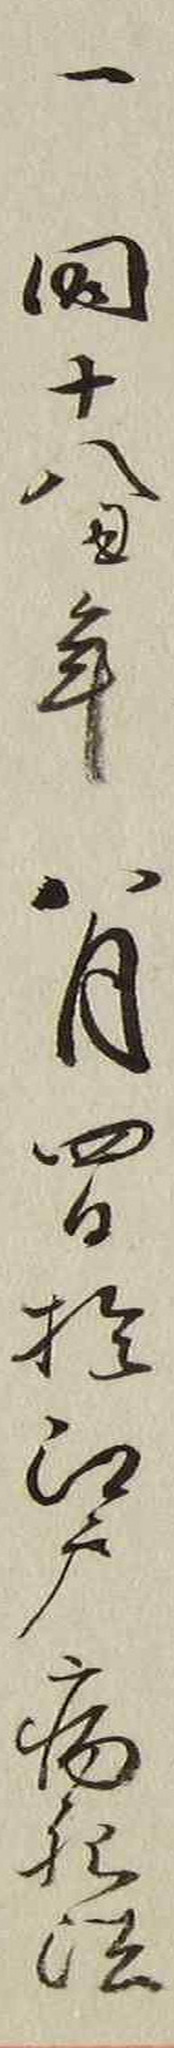一同十八丑年八月四日於江戸病死法
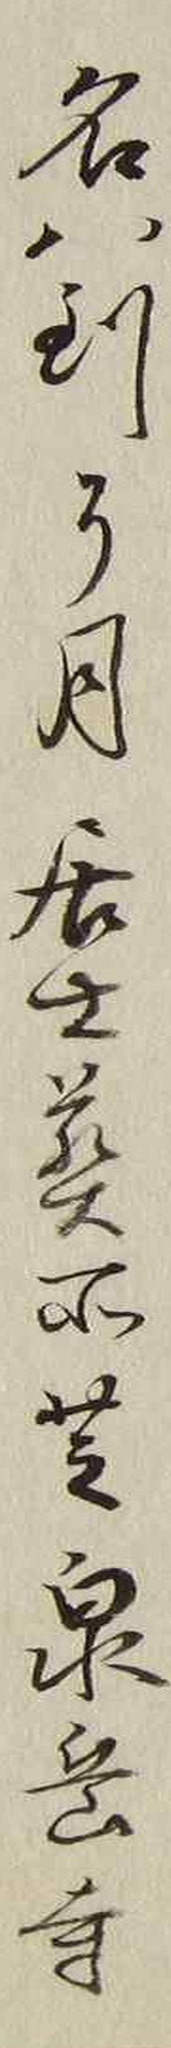名到了月居士葬所芝泉岳寺
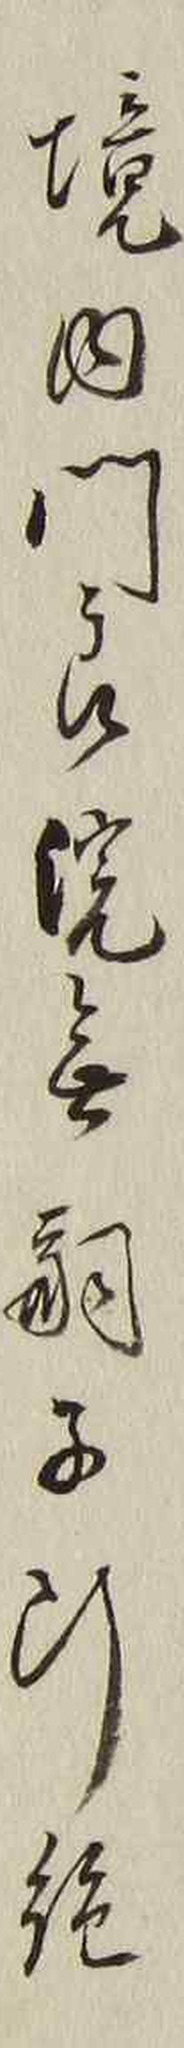境内門良院無嗣子断絶

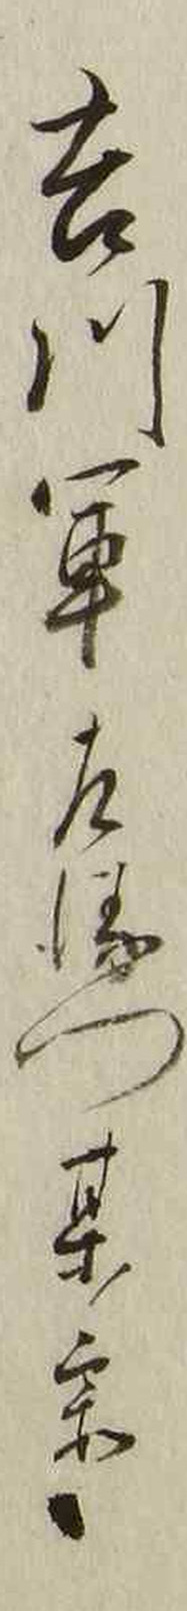女吉川軍左衛門某妻
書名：諸士系譜　巻之159　な之部1
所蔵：会津若松市立会津図書館
